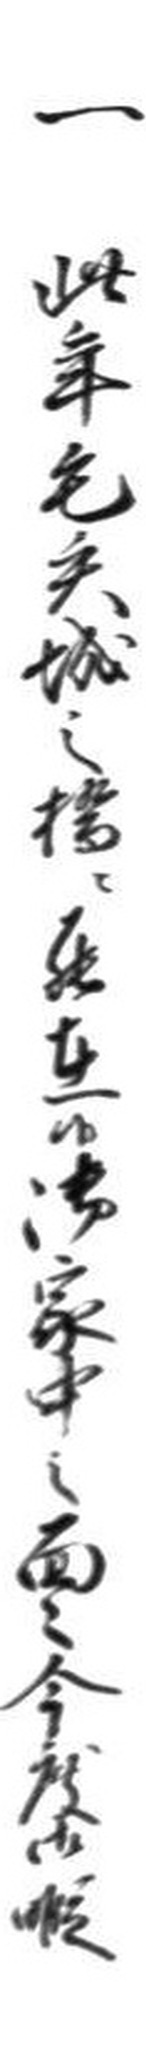一此年毛矢城之橋ニ罷在候御家中之面々今度御暇
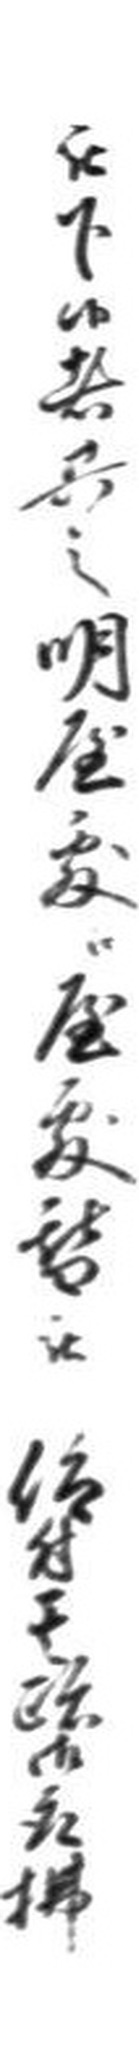被下候者共之明屋敷江屋敷替被仰付其跡御取払
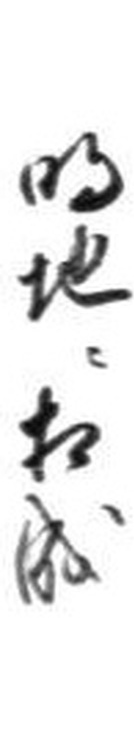明地ニ相成

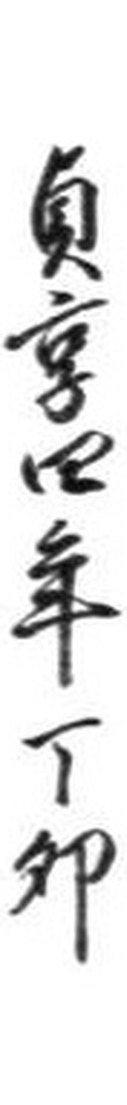貞享四年丁卯
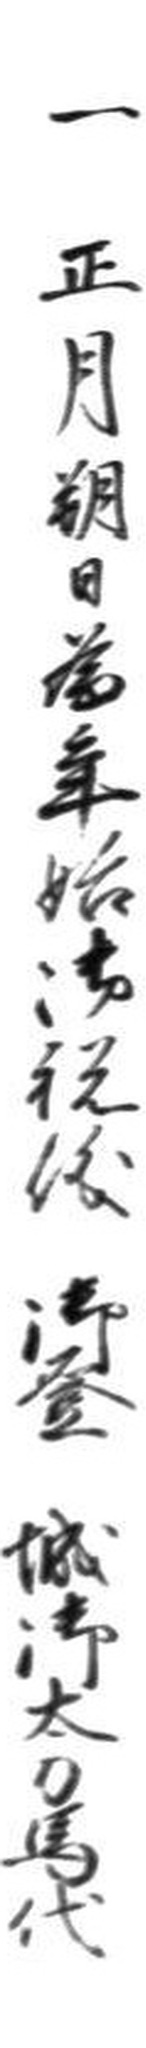一正月朔日為年始御祝儀御登御太刀馬代
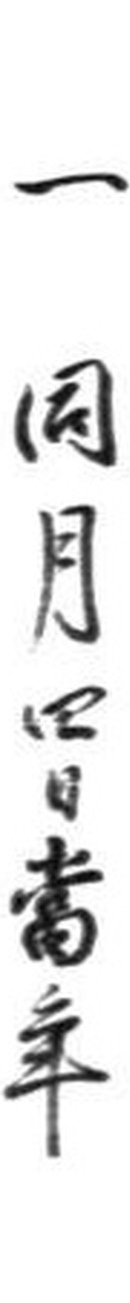一同月四日当年
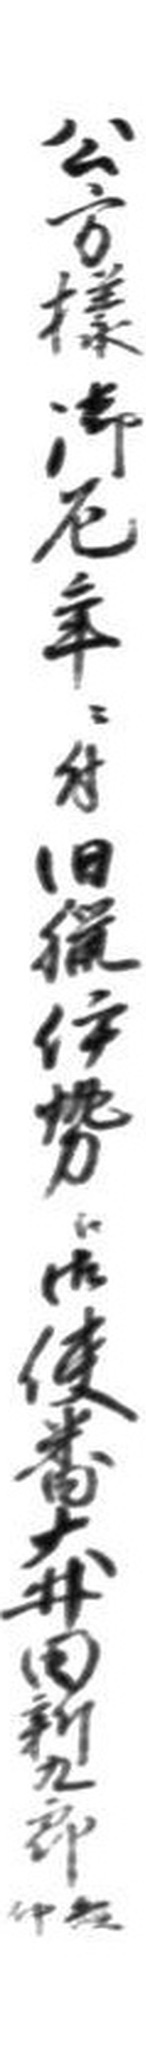公方様御厄年ニ付旧臘伊勢江御使番大井田新九郎仲
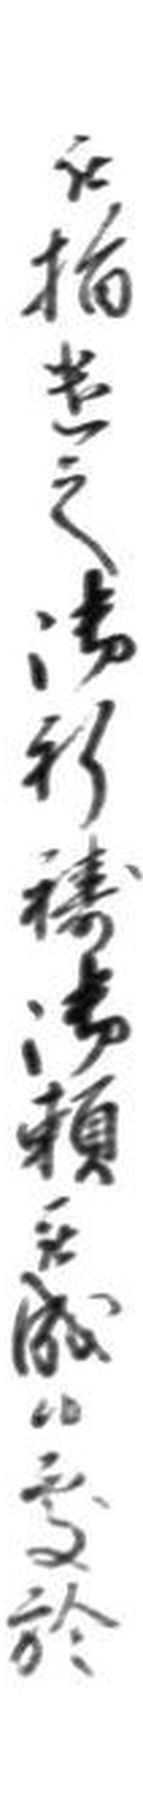被差遣之御祈禱御頼被成候處於
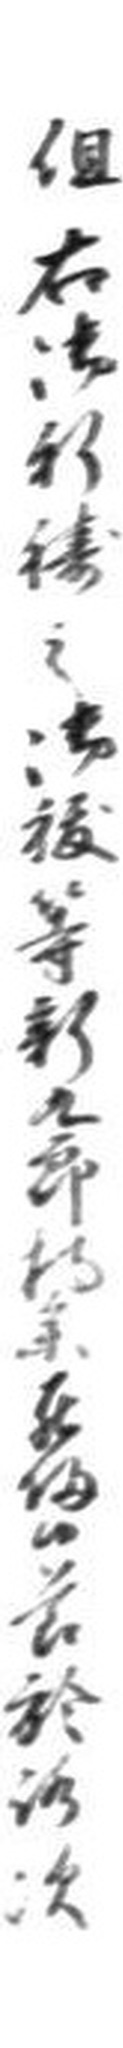但右御祈禱之御祓等新九郎持参罷帰候節於路地
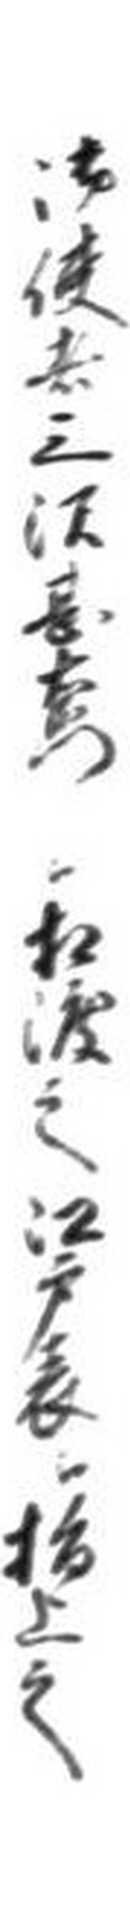御使者三沢甚右衛門江相渡之江戸表江指上之

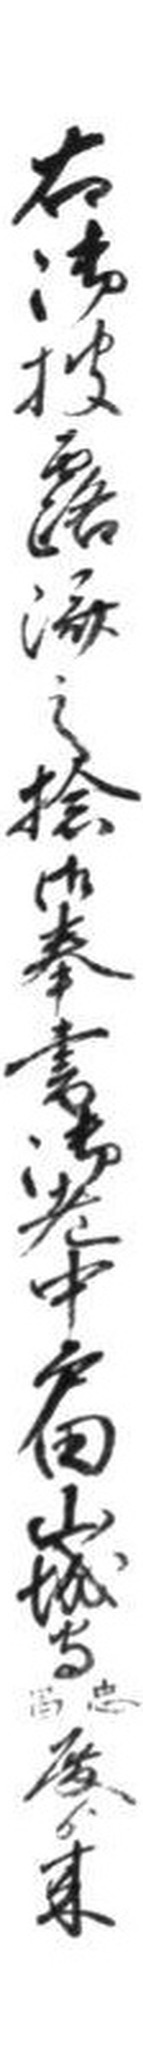右御披露済之捻御奉書御老中戸田山城守忠昌殿ゟ来
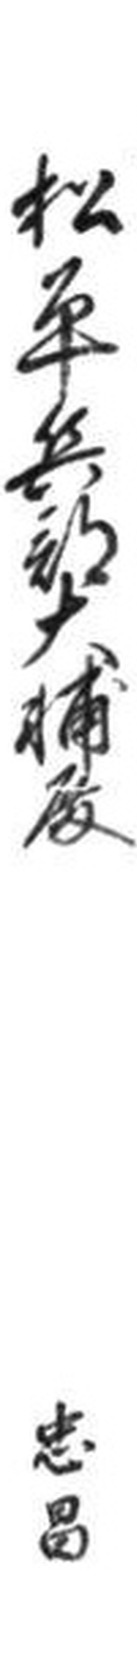松平兵部大輔殿忠昌
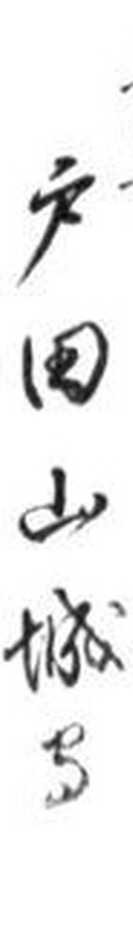戸田山城守
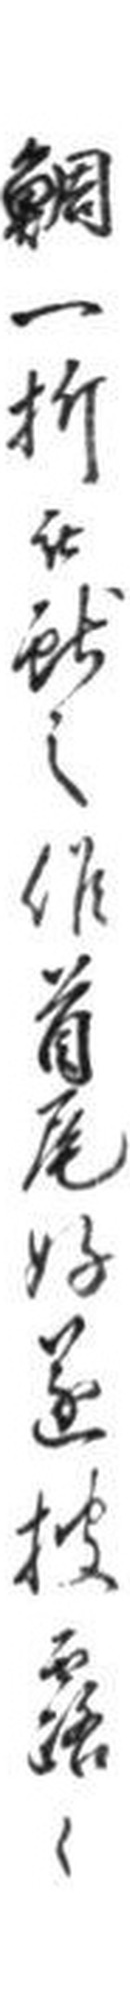鯛一折被献之作首尾好遂披露之
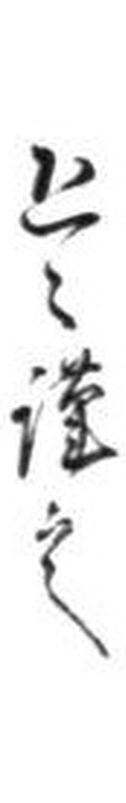恐々謹言
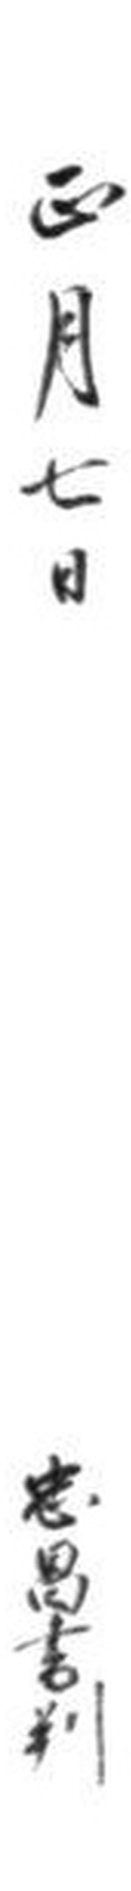正月七日忠昌書判
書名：家譜 十六 吉品公 従貞享三年閏三月到同四年
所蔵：福井県文書館 Fukui Prefectural Archives
